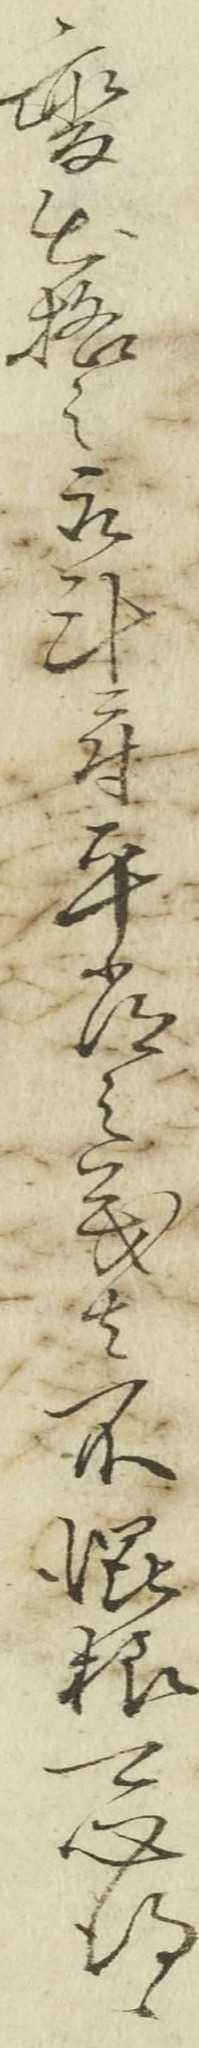変出格之取計ニ付平常之義者不混様可心得候
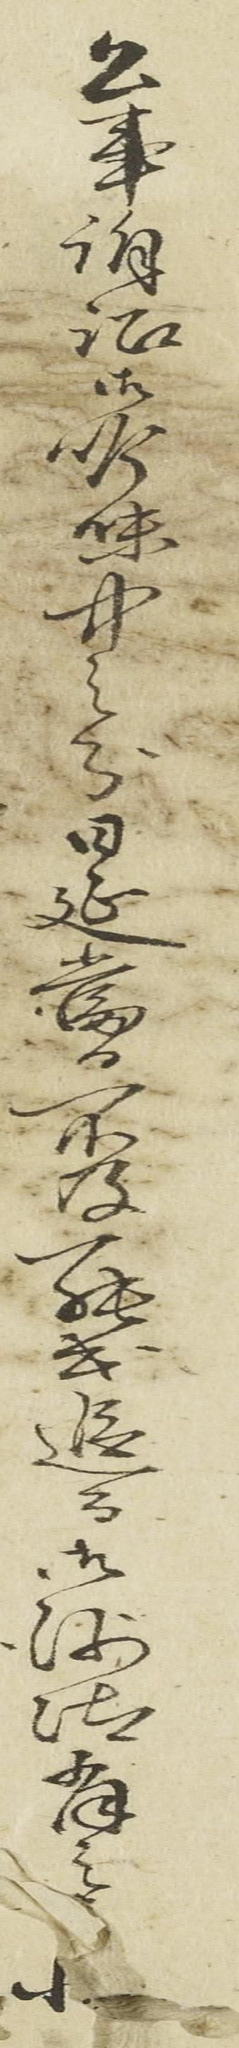一公事訴訟御吟味中之分日延当日不及罷出追而御沙汰有之
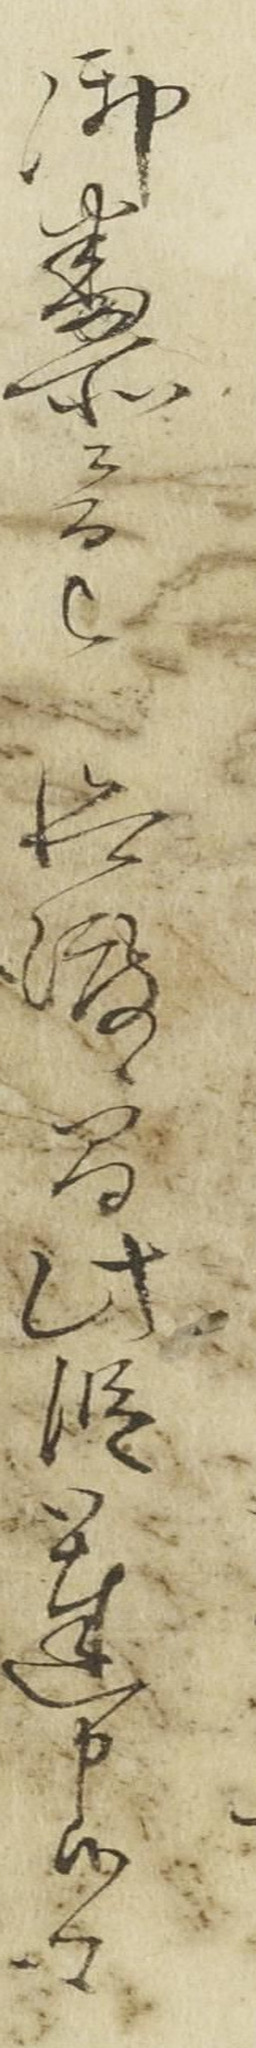御番所ニ而被仰渡候間此段御達申候以上
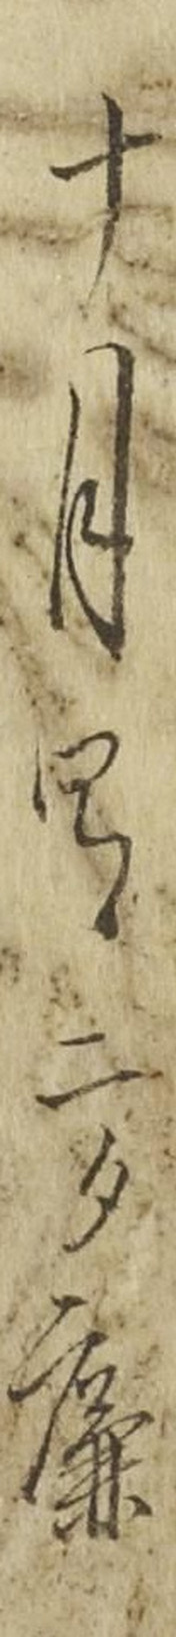十月四日ニ夕廉
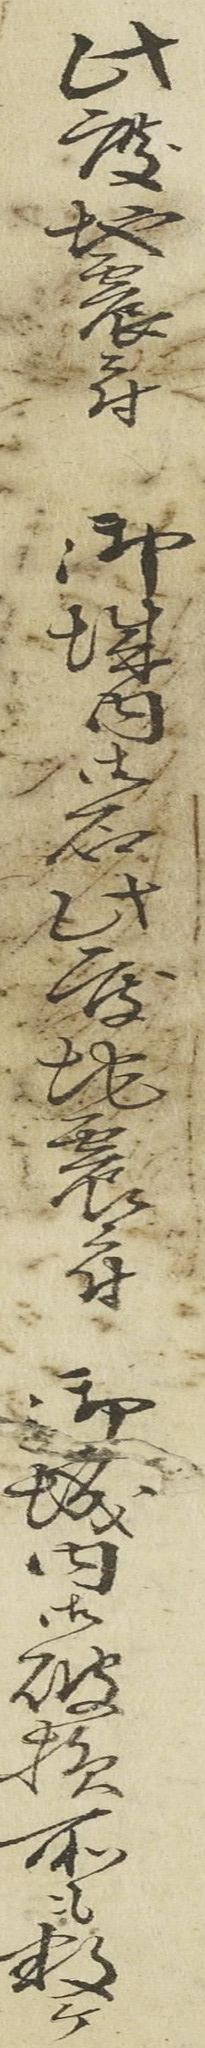此度地震二付御城内御石此度地震二付御城内御破損所も数ケ
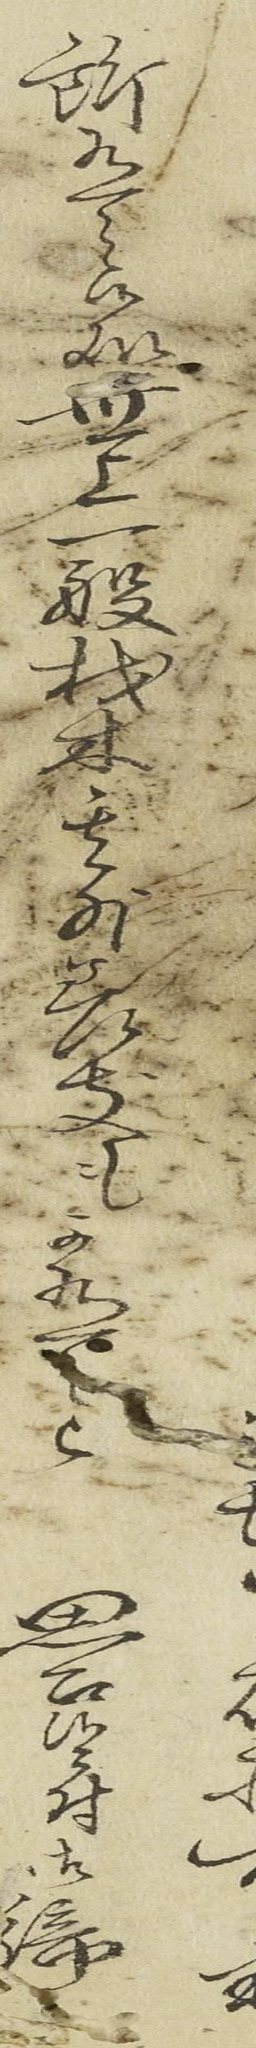所有之候処世上一般材木其外差支も可有之被思召候ニ付御締
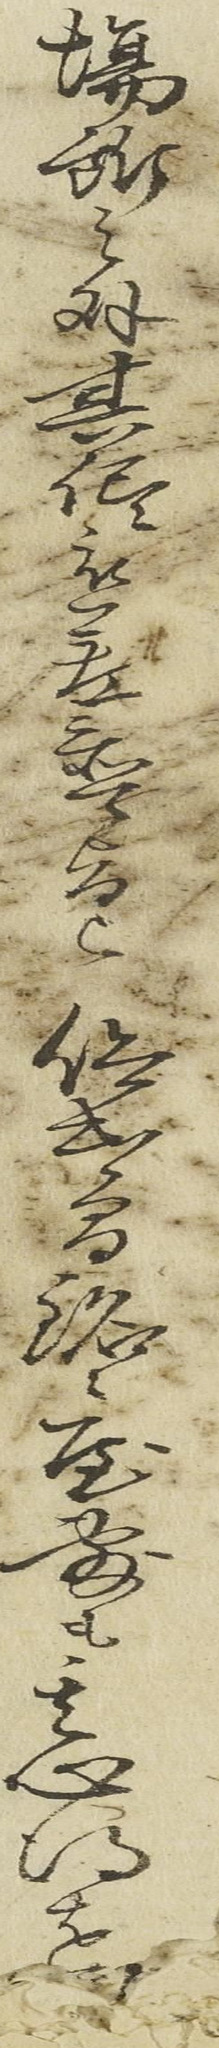場所之外其侭被差置候旨被仰出候間銘々屋敷も其心得を
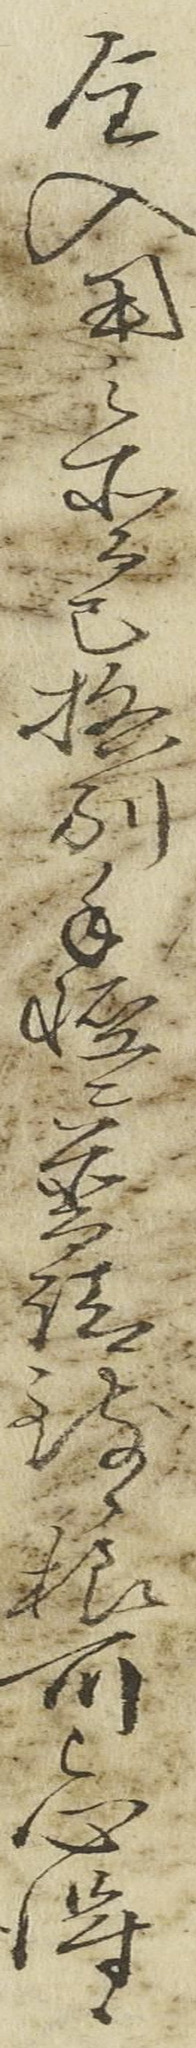金入用之所而已格別手軽ニ普請致候様可被心得候
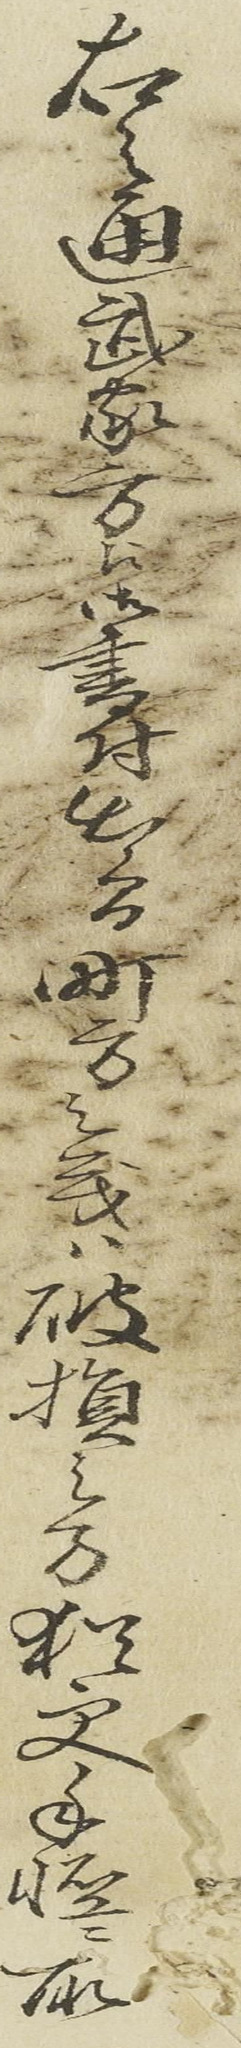右之通武家方え御書付出候間町方之義ハ破損之分猶更手軽二取
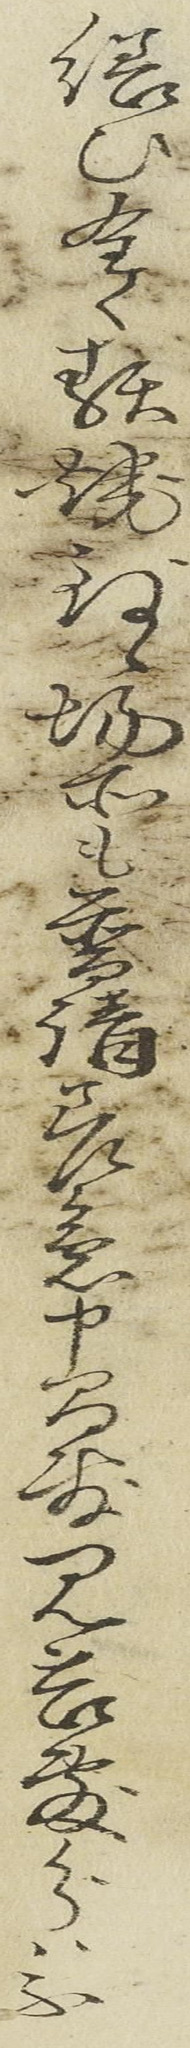繕ひ全く類焼致候場所も普請差急申間敷見苦敷分ハ不
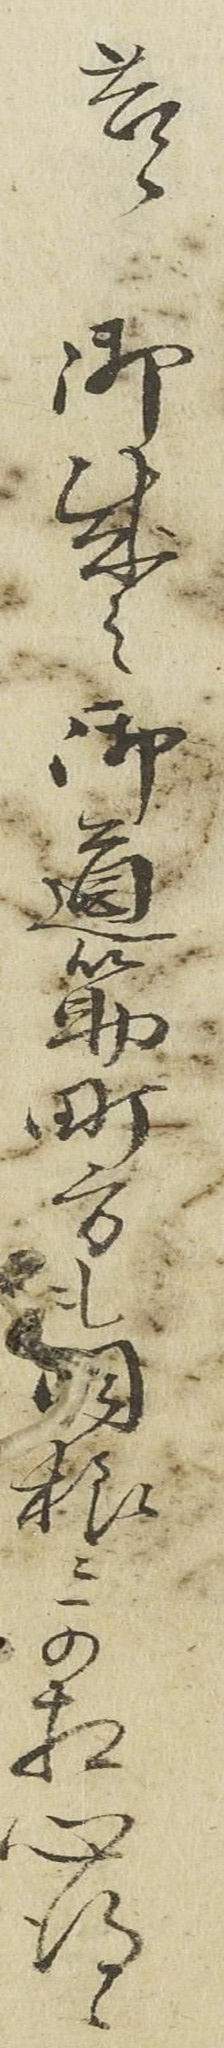苦候御成之御道筋町方も同様ニ可相心得候
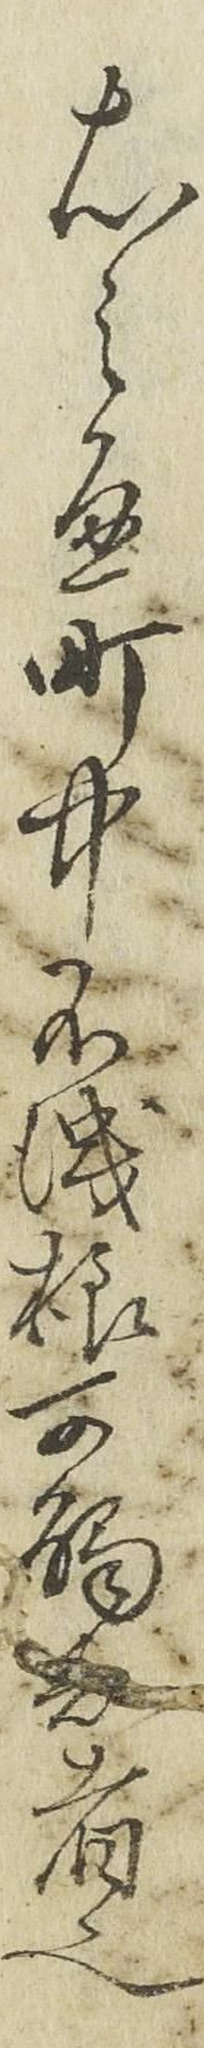右之通町中不洩様可触知者也
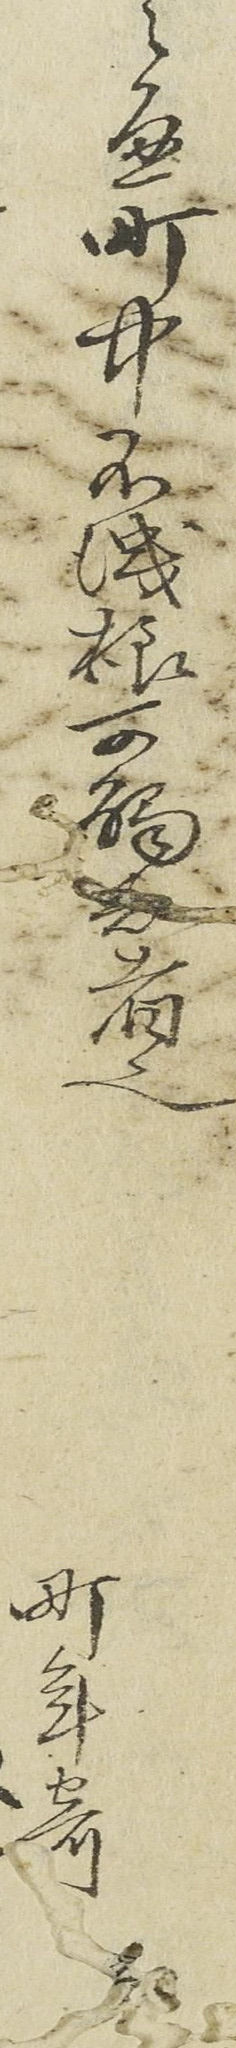右之通町中不洩様可触知者也

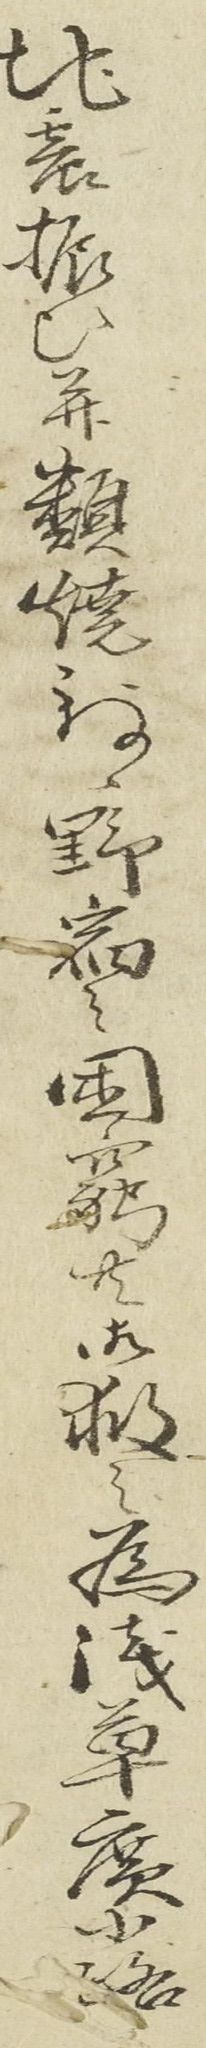地震振ひ幷類焼致候野宿之困窮共御救之為浅草広小路
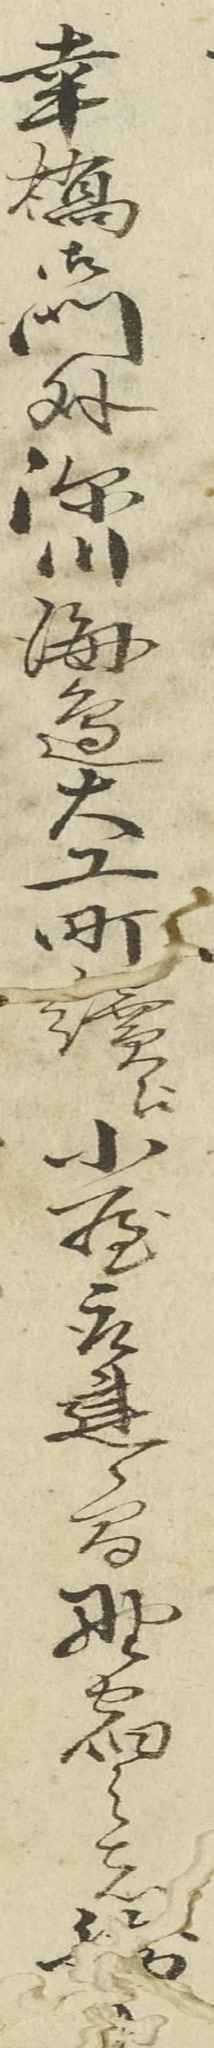幸橋御門外深川海辺大工町続え小屋取建候間野宿之者勝手
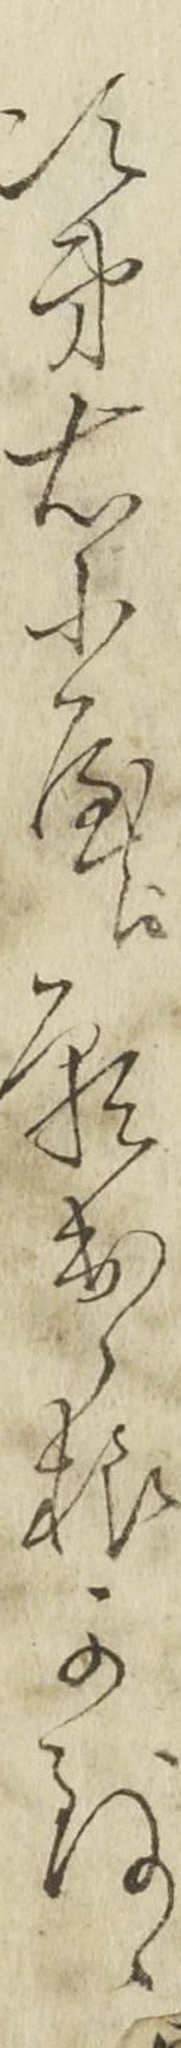次第右小屋え願出候様可致候
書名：安政二乙卯年十月二日大地震之事
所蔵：東京大学地震研究所図書室 Earthquake Research Institute Library, The University of Tokyo, JAPAN
